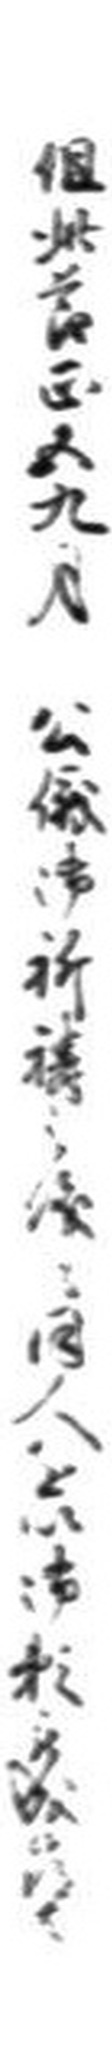但此節正五九月公儀御祈禱之儀は同人を以御頼被成候得共
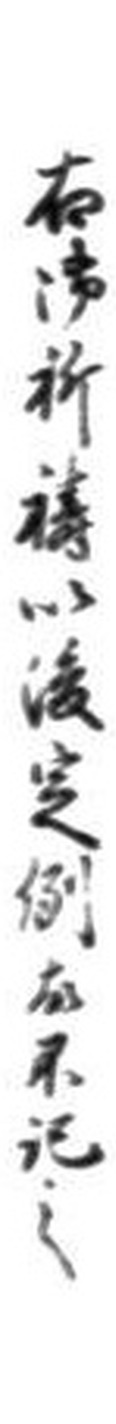右御祈禱以後定例故不記之
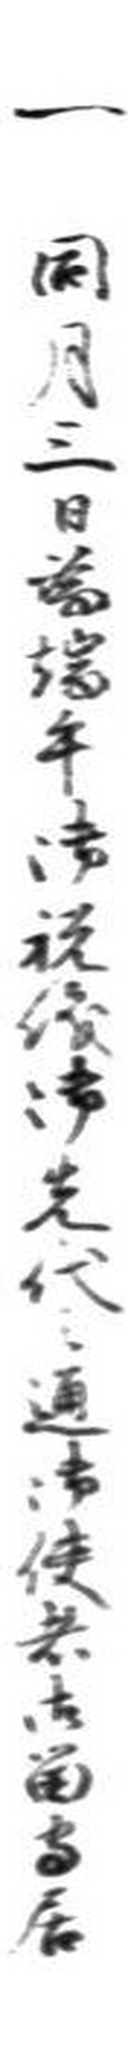一同月三日為端午御祝儀御先代之通御使者御留守居
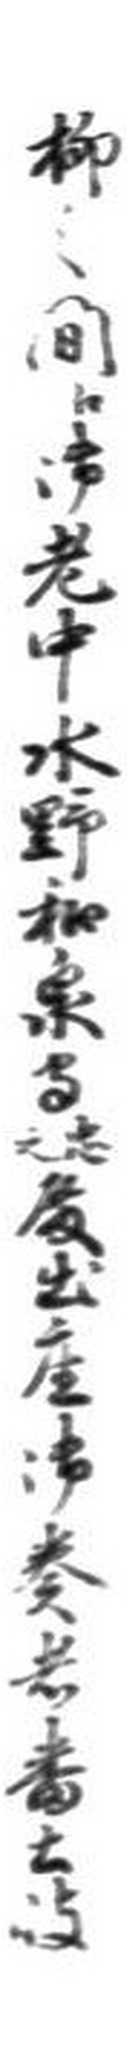柳之間江御老中水野和泉守忠之殿出座御奏者番土岐
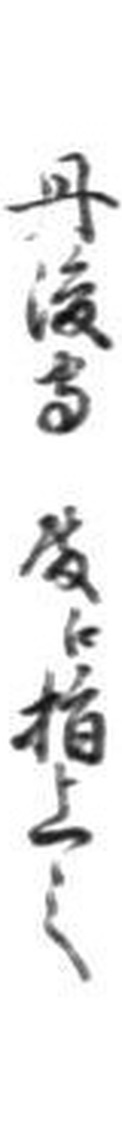丹後守殿江指上之
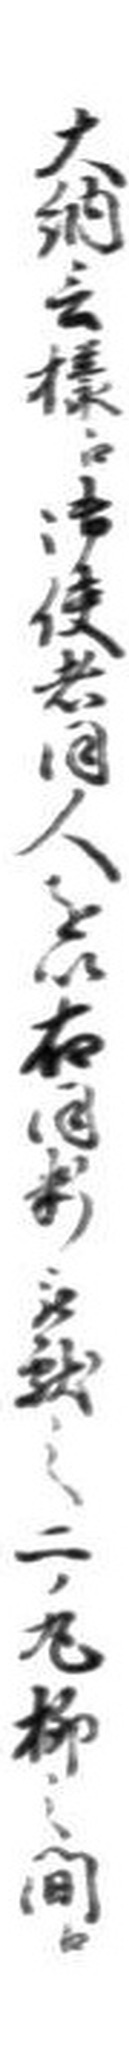大納言様江御使者同人を以右同断被献之二ノ丸柳之間江
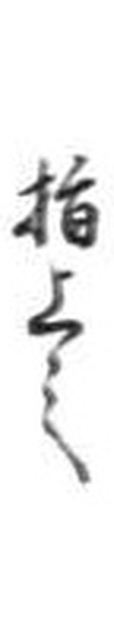指上之

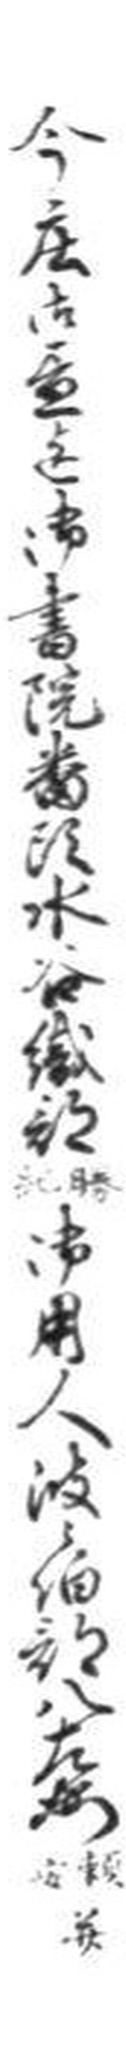今庄御昼迄御書院番頭水谷織部勝紀御用人波々伯部八左衛門頼安幷
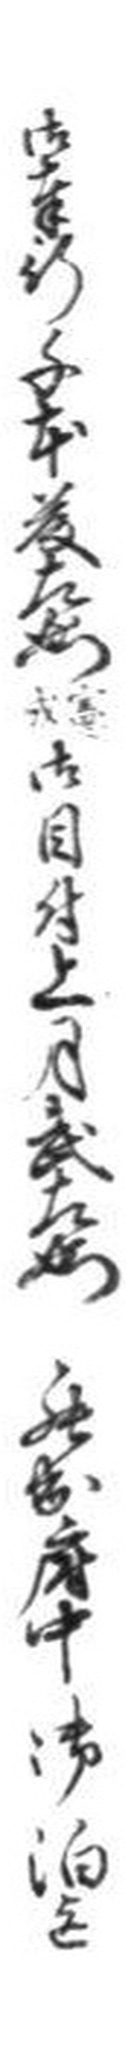御奉行千本藤左衛門憲成御目付上月武左衛門罷出府中御泊迄
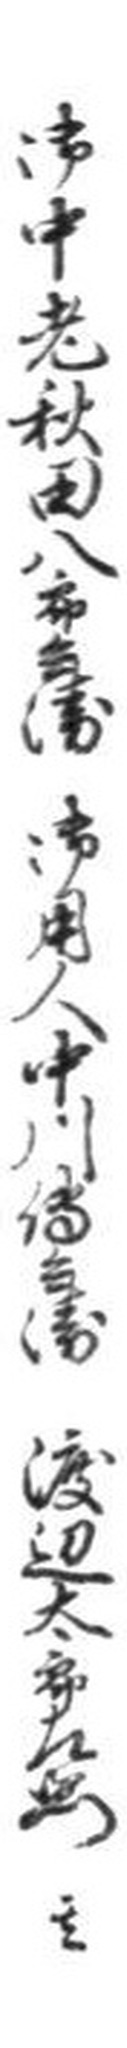御中老秋田八郎兵衛御用人中川伝兵衛渡辺太郎左衛門其
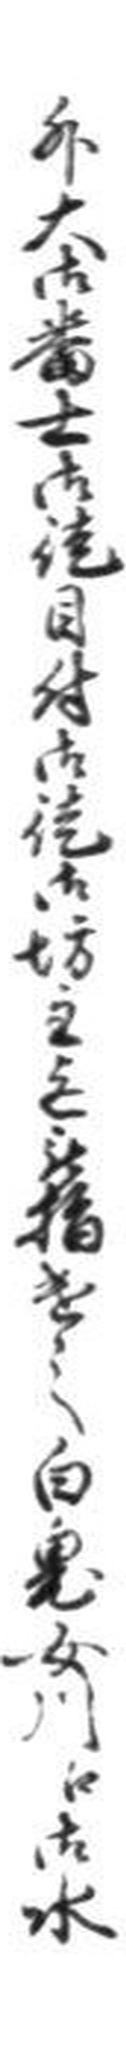外大御番士御徒目付御徒御坊主迄被指遣之白鬼女川江御水
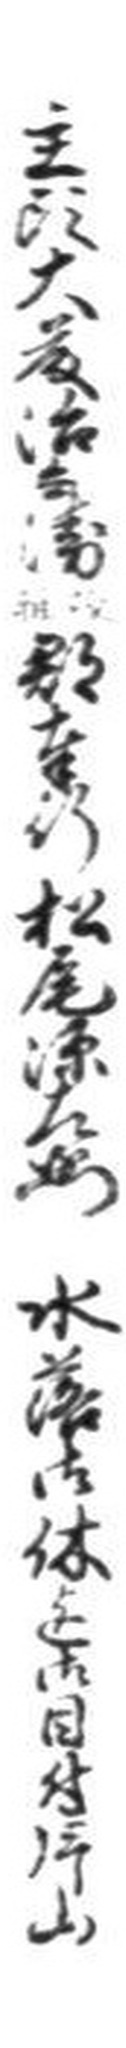主頭大藤治兵衛茂雅郡奉行松尾源左衛門水落御休迄御目付片山
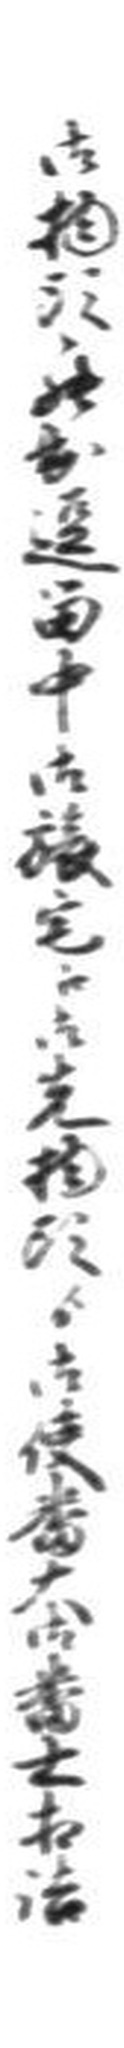御物頭罷出逗留中御旅宅江御先物頭ゟ御使番大御番士相詰
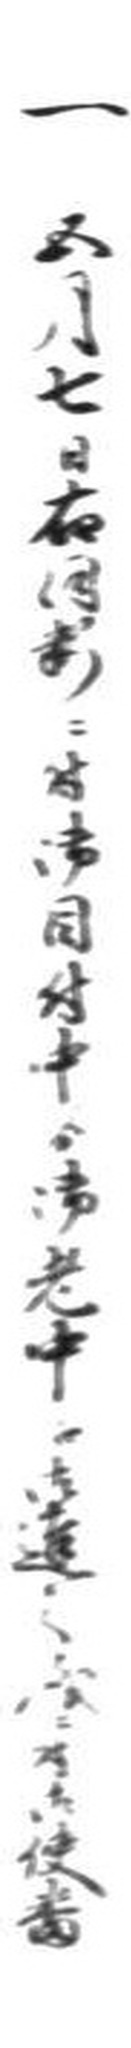一五月七日右同断ニ付御目付中ゟ御老中江御達之儀ニ付御使番
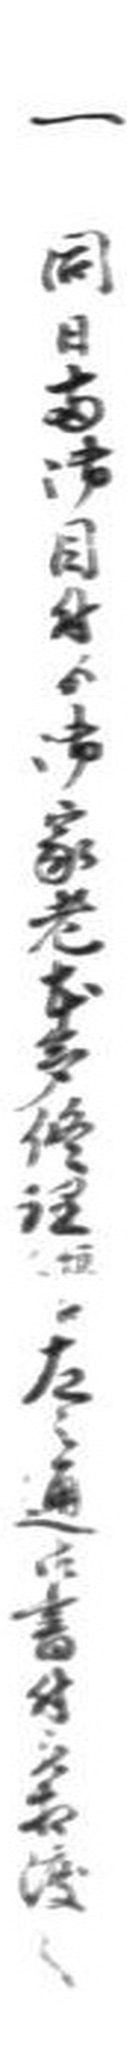一同日両御目付ゟ御家老本多修理恒久江左之通御書付被相渡之
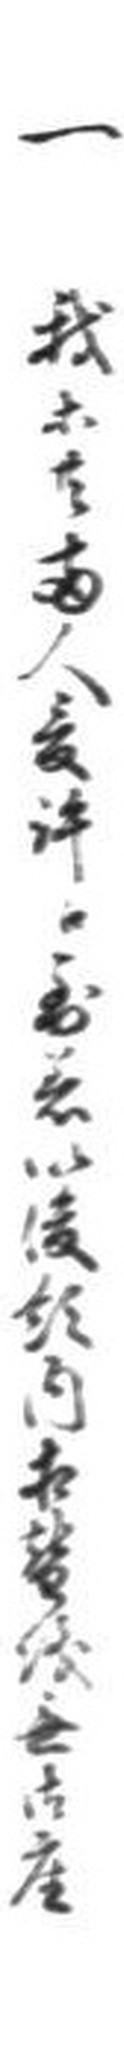一我等共両人爰許江到着以後領内相替儀無御座
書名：家譜 三十九 宗矩公 享保十年
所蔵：福井県文書館 Fukui Prefectural Archives
